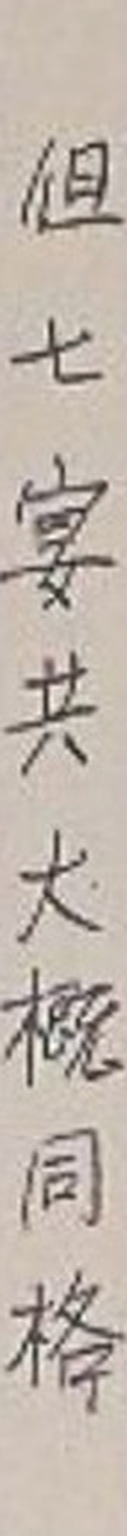但七宴共大概同格
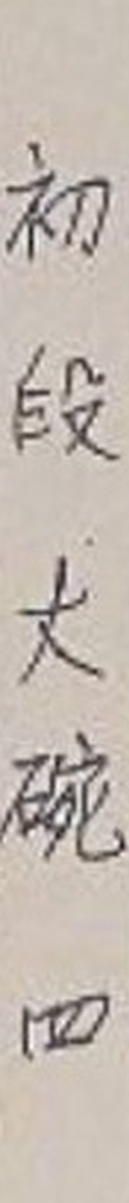初段大碗四
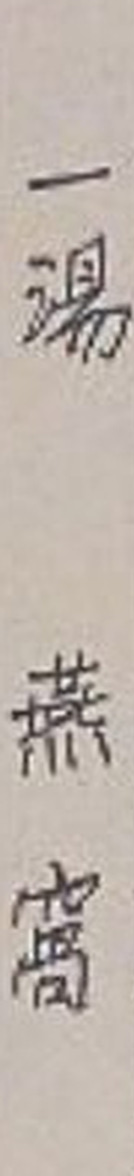一湯燕窩

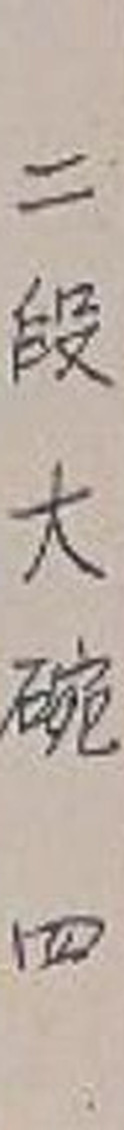二段大碗四
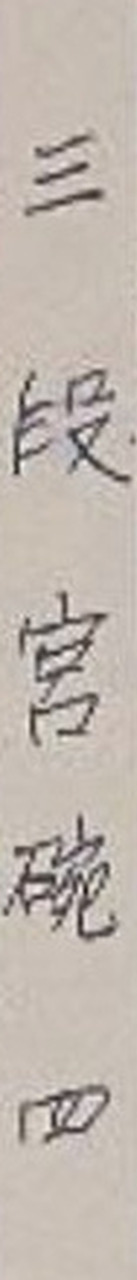三段宮碗四
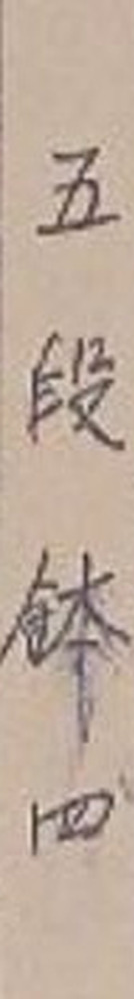五段鉢四

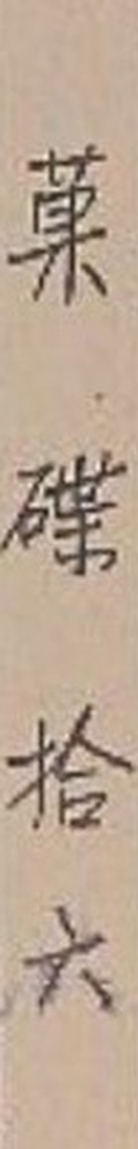菓碟拾六
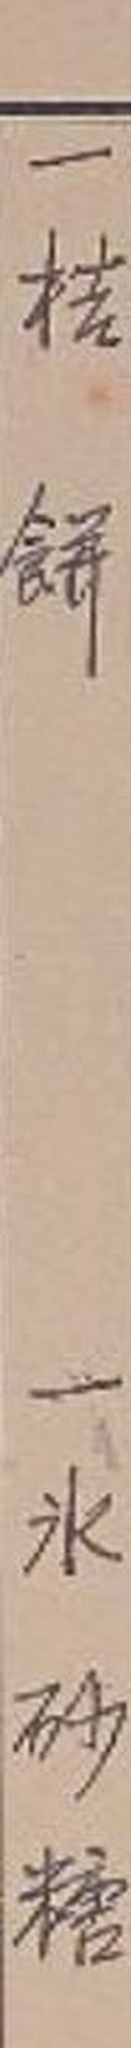一桔餅一氷砂糖
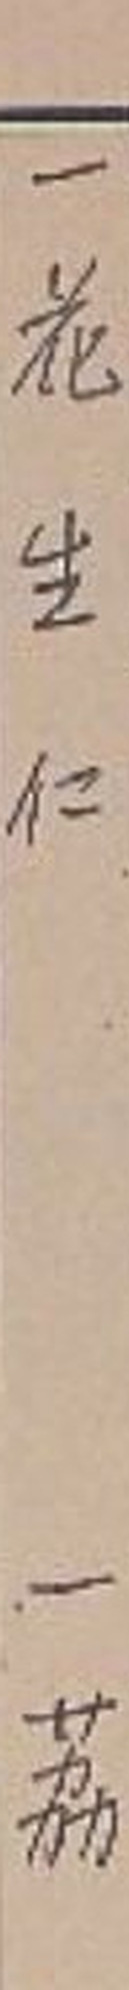一花生仁一荔枝

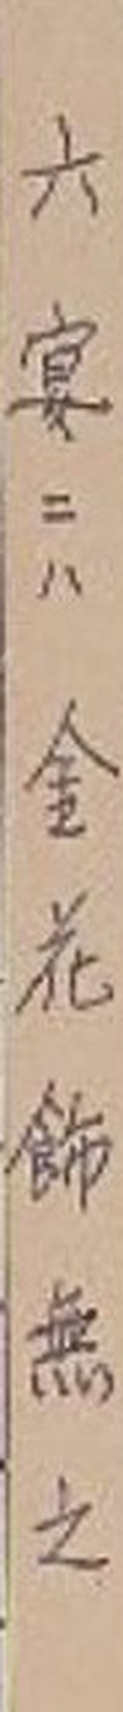六宴には金花飾無之
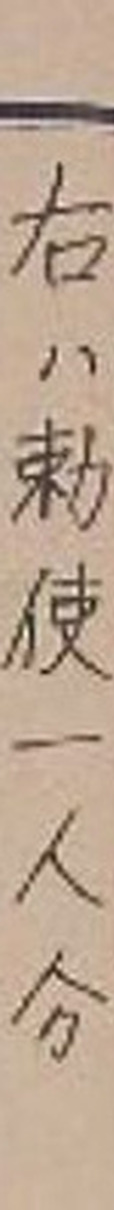右は勅使一人分
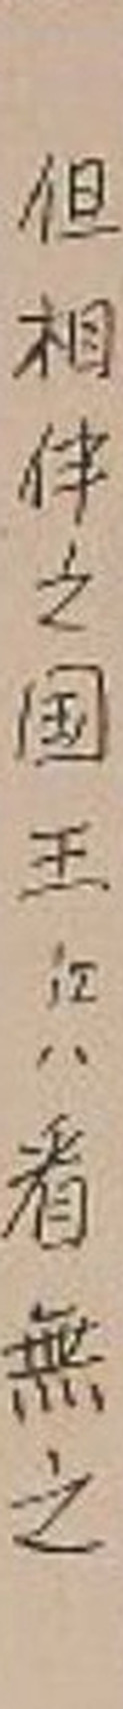但相伴之国王えは看無之
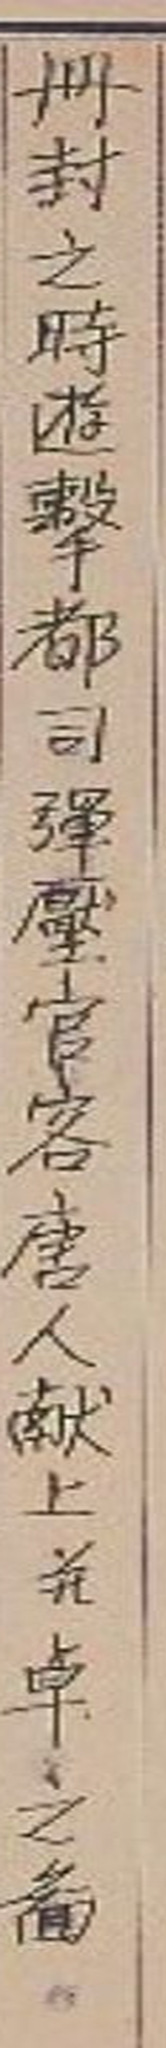冊封之時遊撃都司弾圧官客唐人献上并卓之図
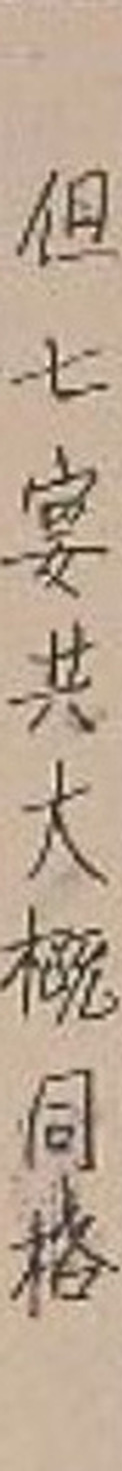但七宴共大概同格
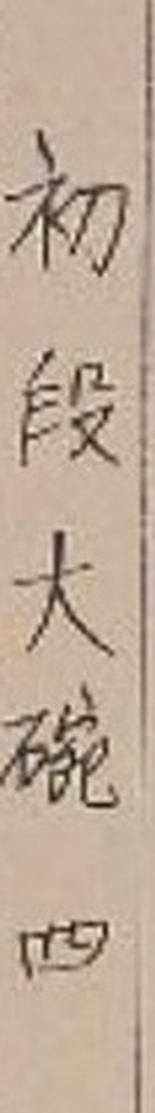初段大碗四

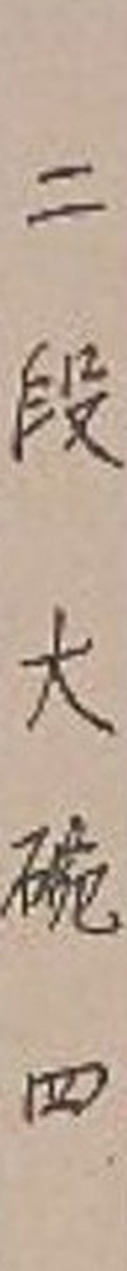二段大碗四
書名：支那冊封使来琉諸記 下巻
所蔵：University of the Ryukyus Library
